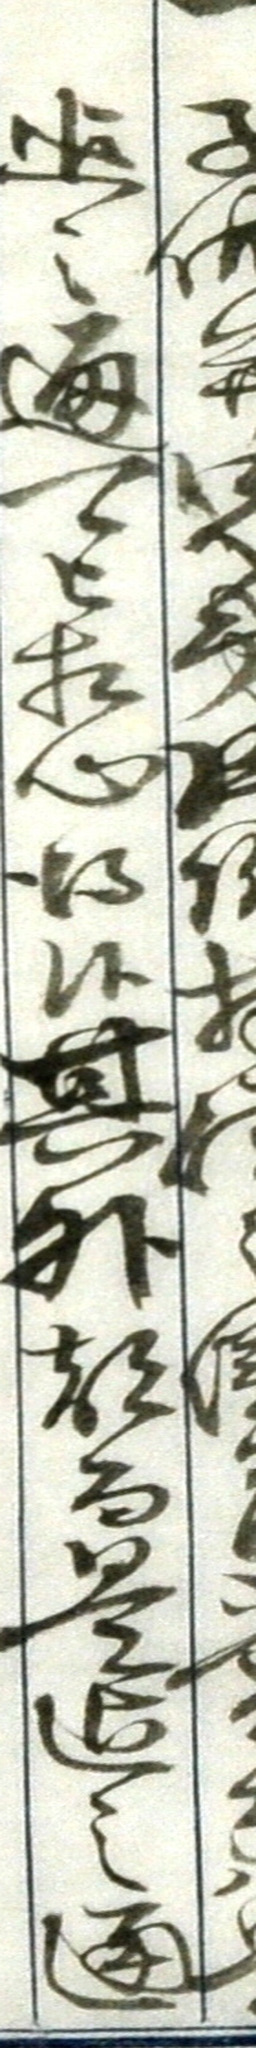迄之通可相心得候其外都而是迄之通
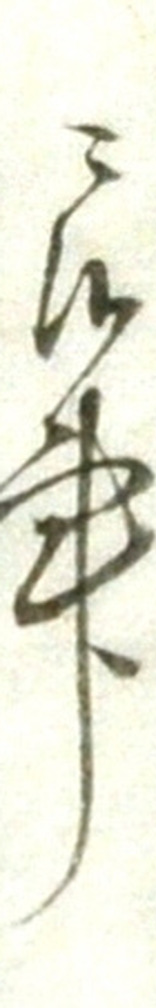ニ候事
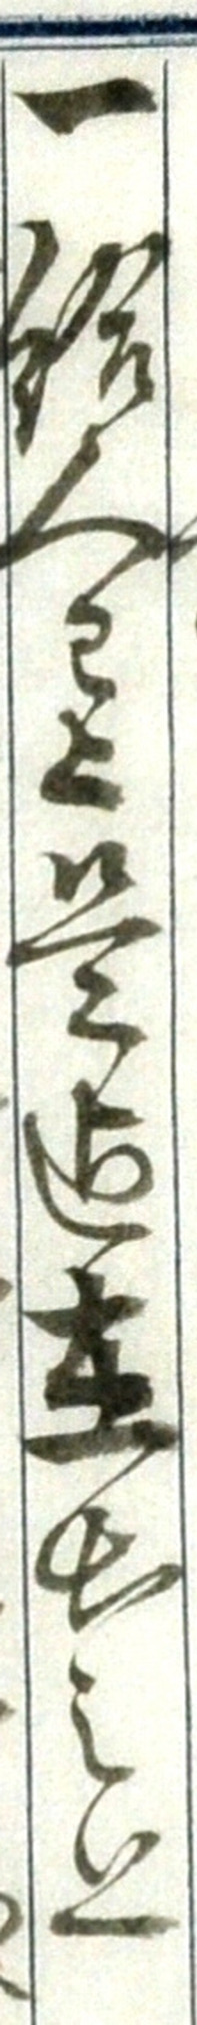一給人已上是迄在出之上
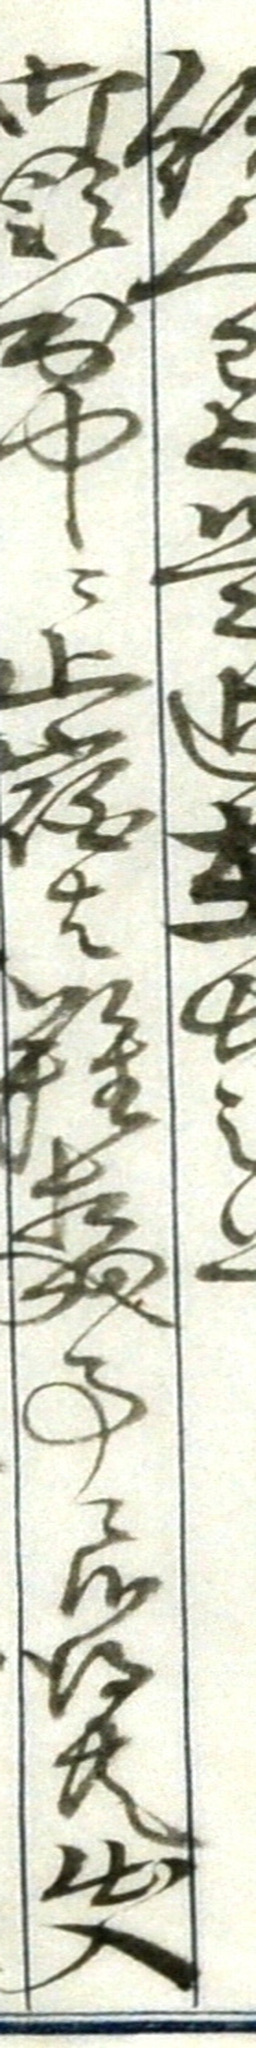御領分中ニ止宿は難相成事ニ候得共出入
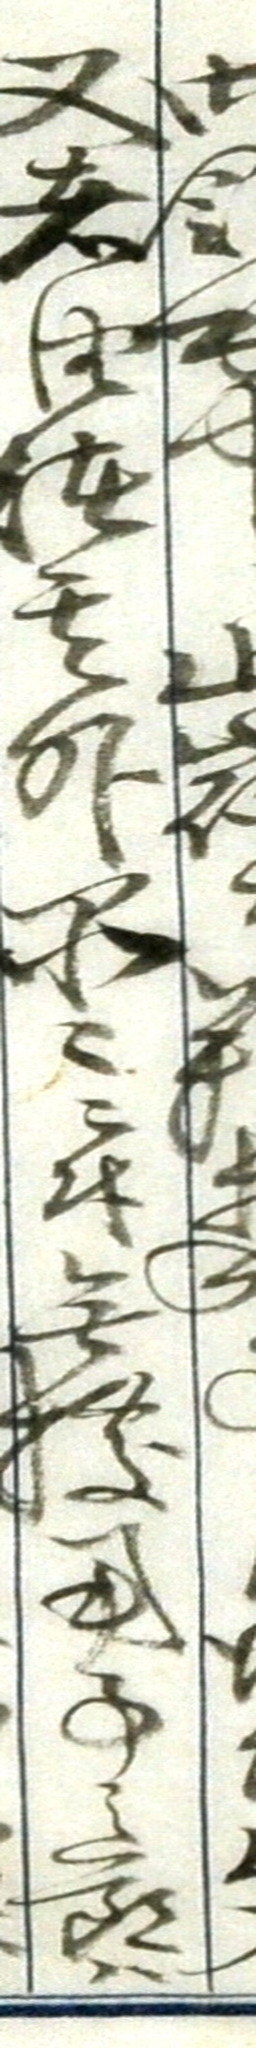又者由緒其外品々ニ付無拠用事之節ハ
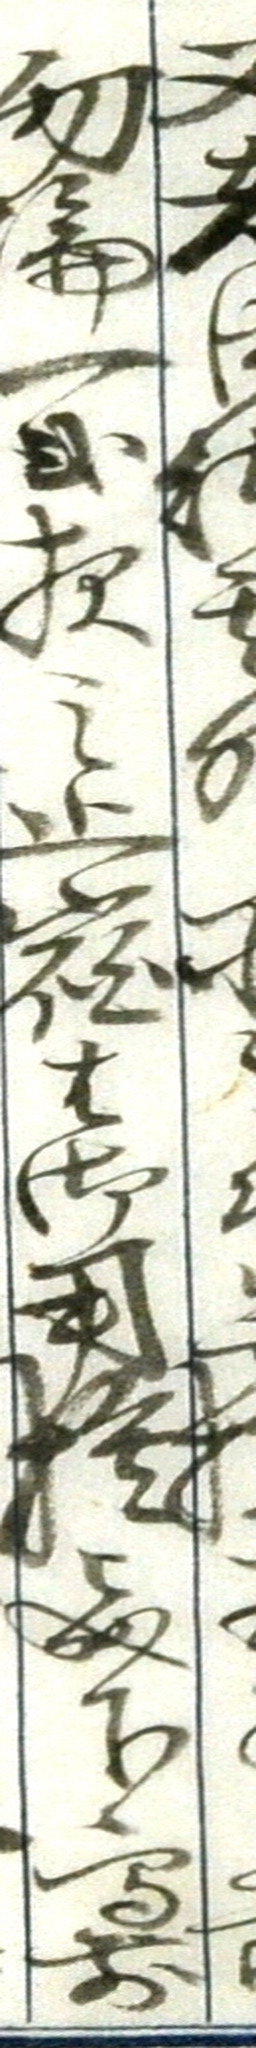勿論一弐夜之止宿は御用捨被成下候間別
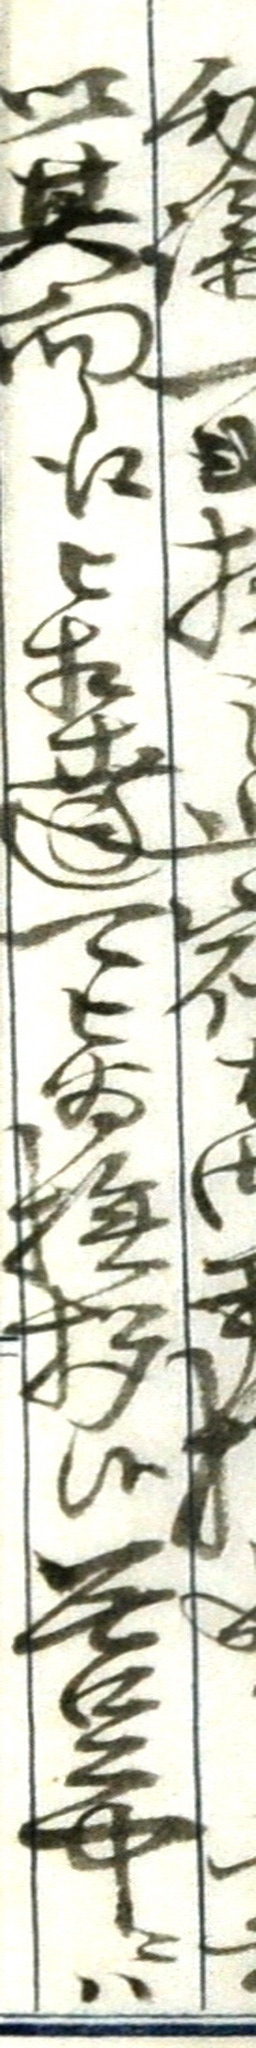以其向江被相達可為挨拶候無足中ニハ

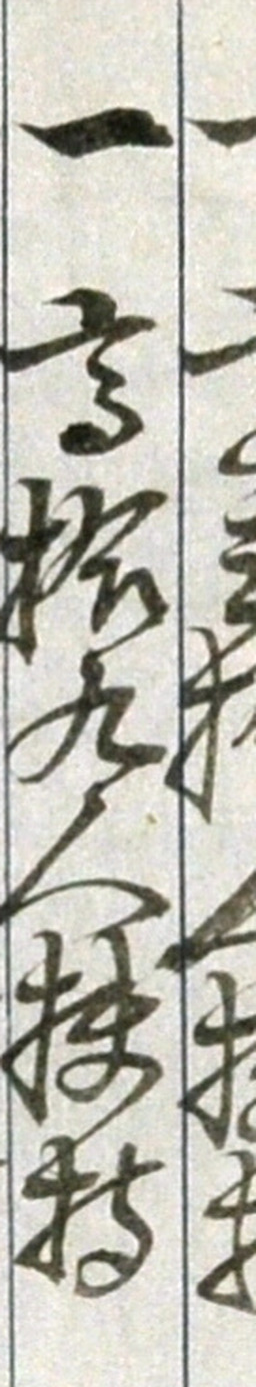一高九人扶持無引
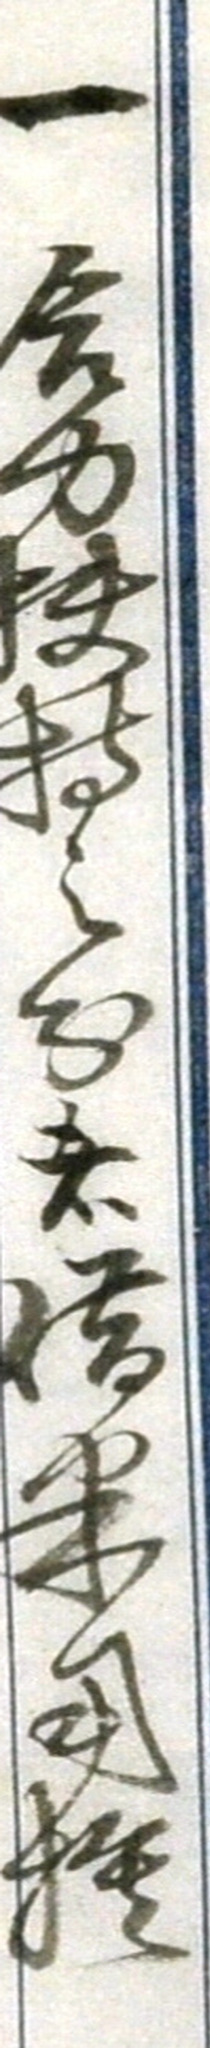一合力扶持之分者借米用捨
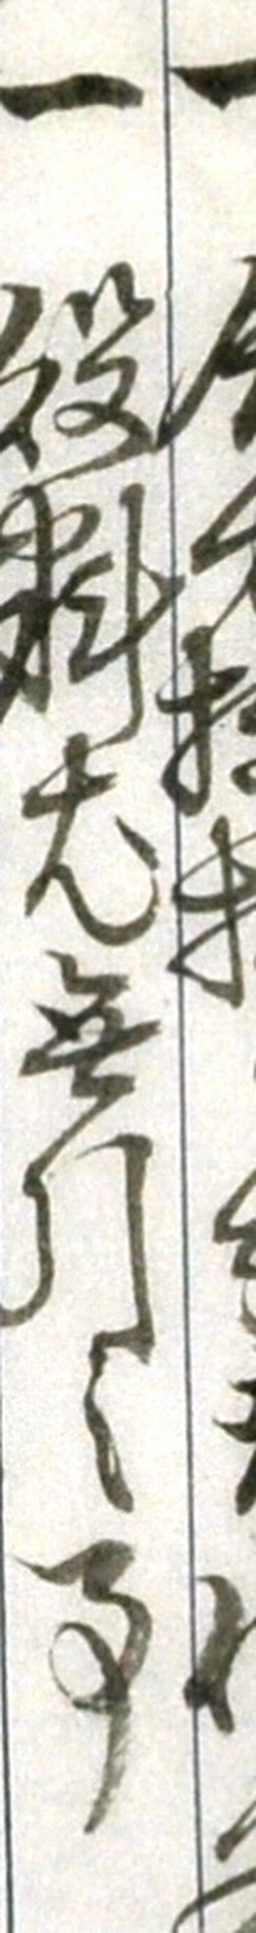一役料尤無引之事
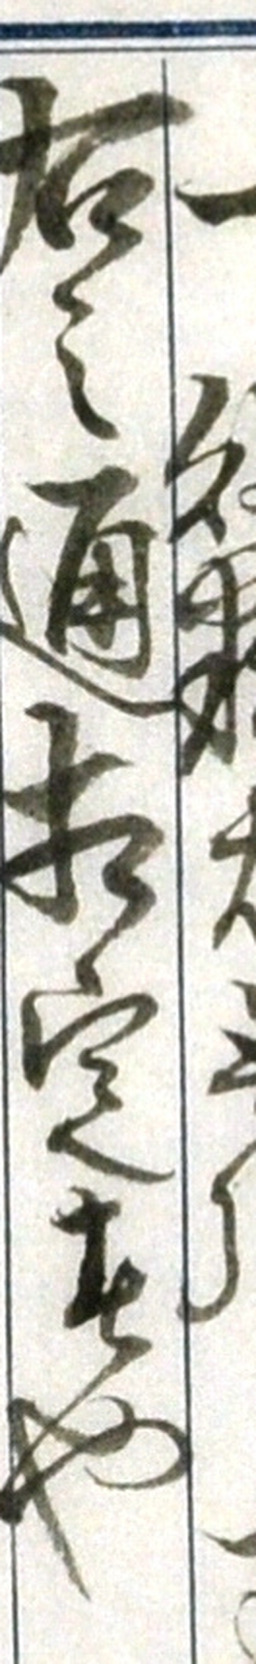右之通相定者也
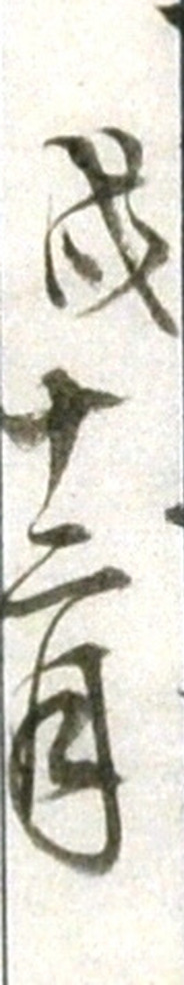戌十二月
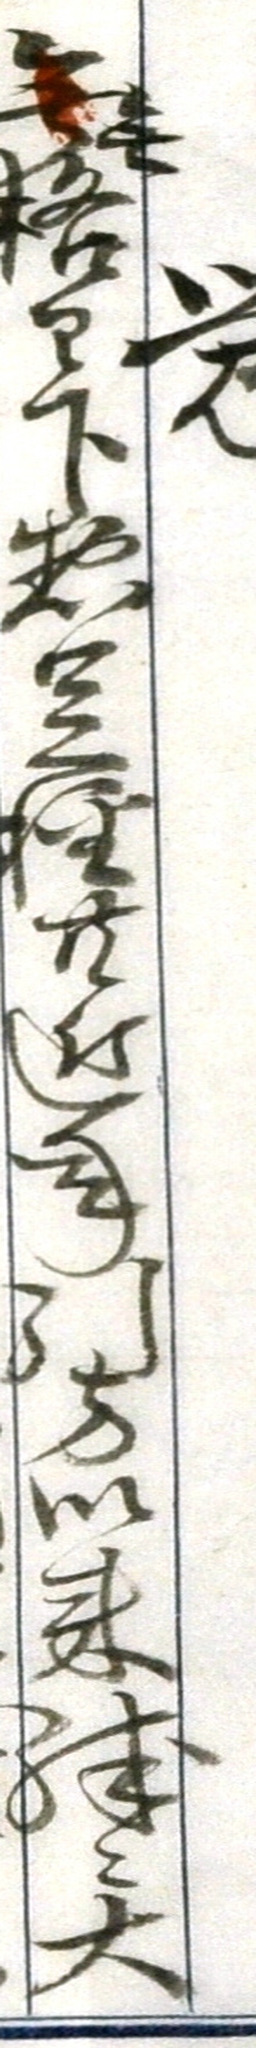無格已下惣足軽共近年引方以来殊ニ大
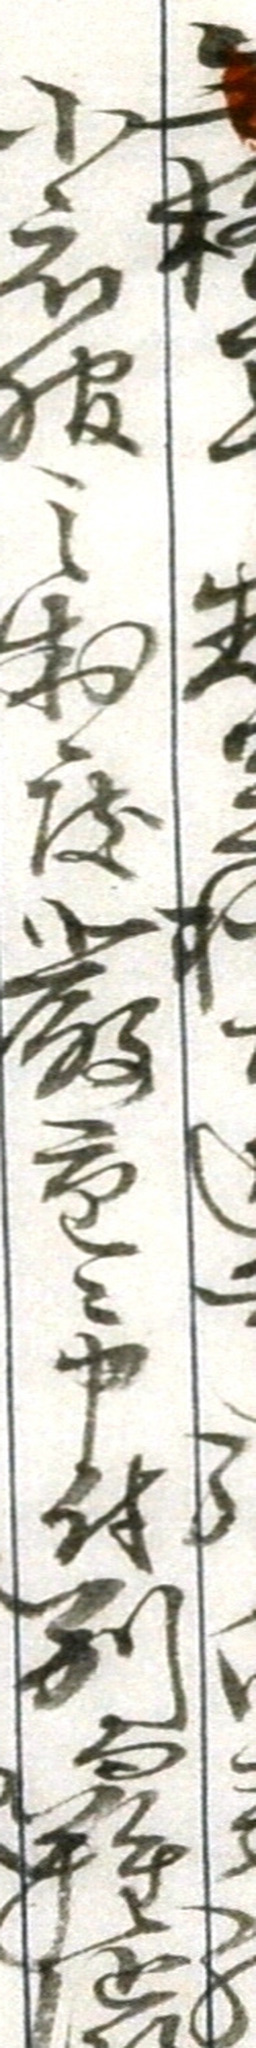小衣服之出度厳重ニ申付別而難渋之内
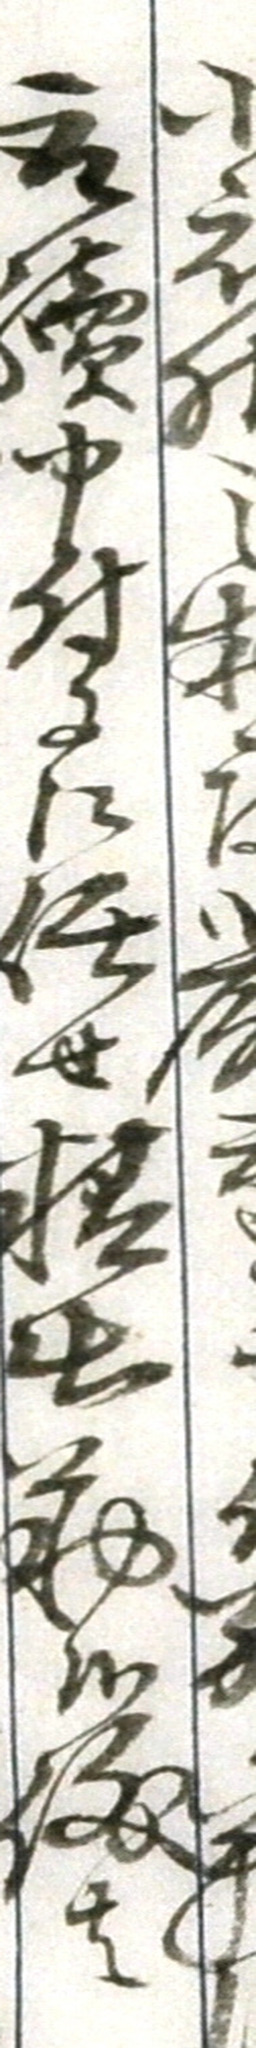取続申付るに任せ精出勤候儀者
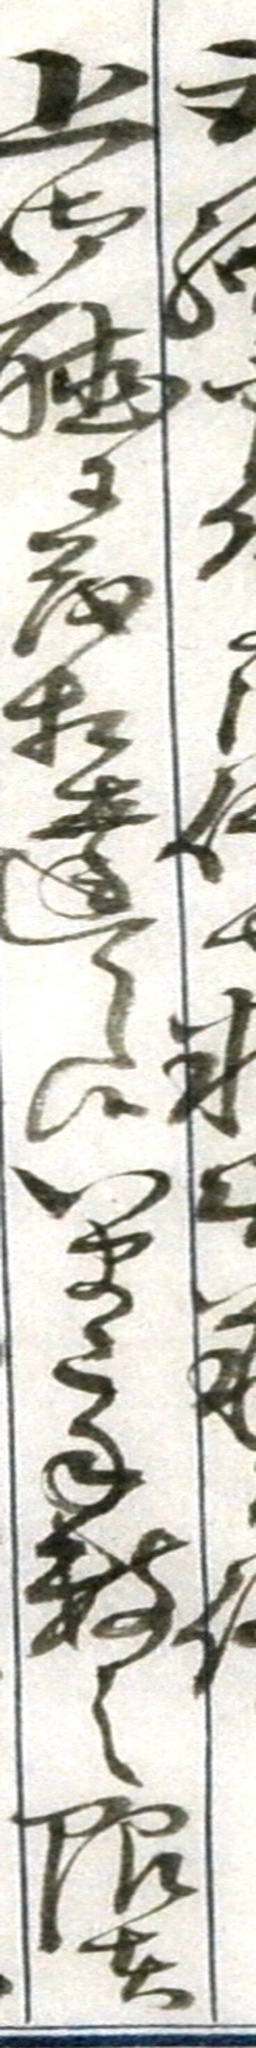上御聴に茂相違し候いまた手数之限者
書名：御倹約御直書并仰書
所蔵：伊那市立高遠町図書館・合同会社AMANE
